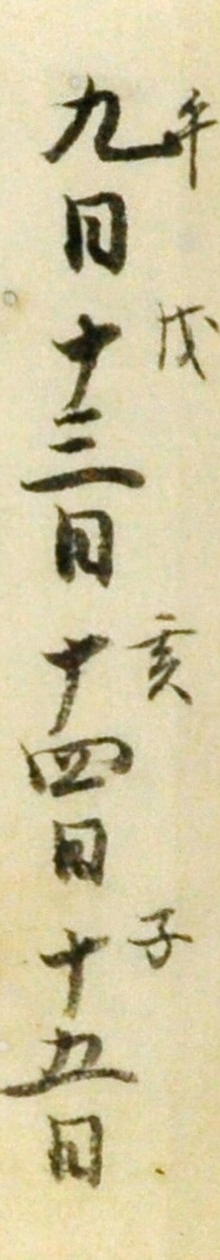九日十三日十四日十五日
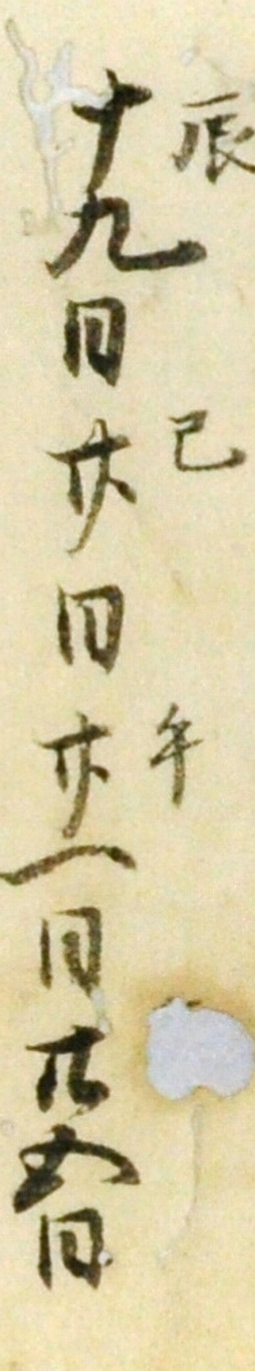十九日廿日廿一日廿五日
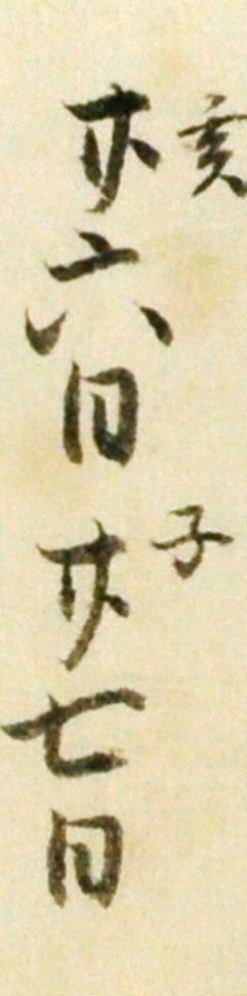廿六日廿七日
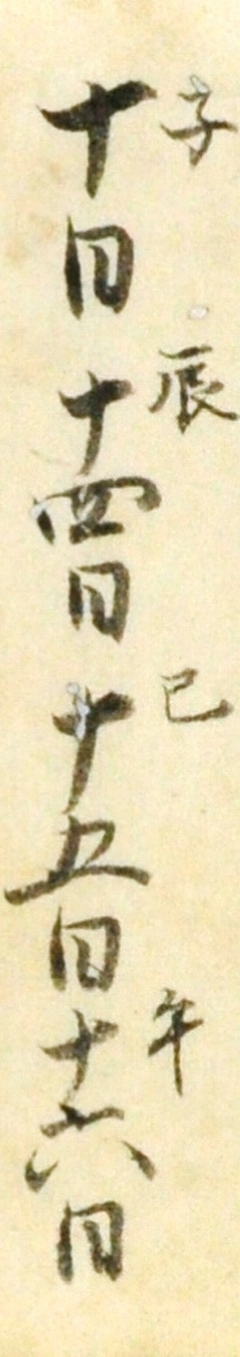十日十四日十五日十六日
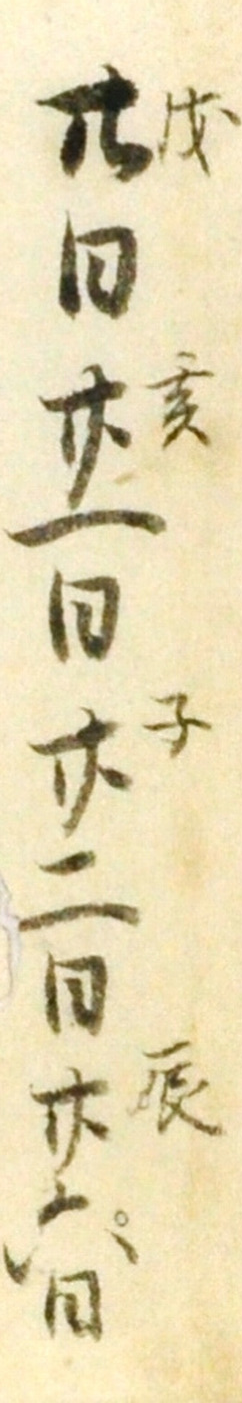廿日廿一日廿二日廿六日
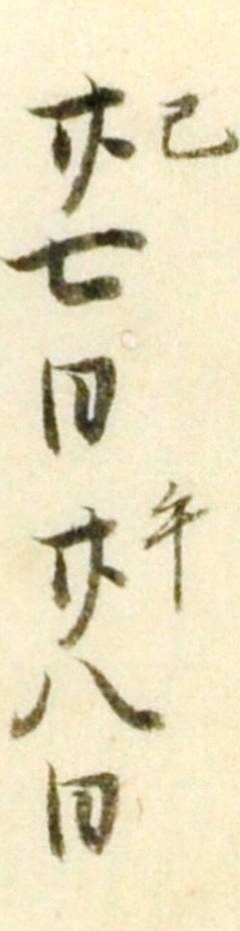廿七日廿八日
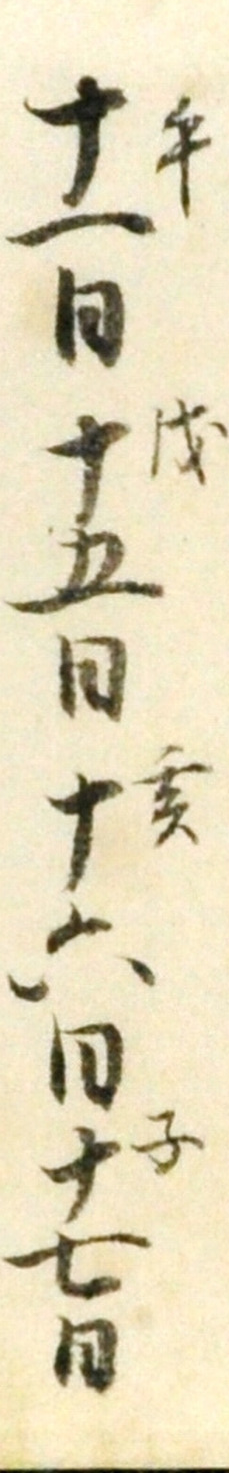十一日十五日十六日十七日
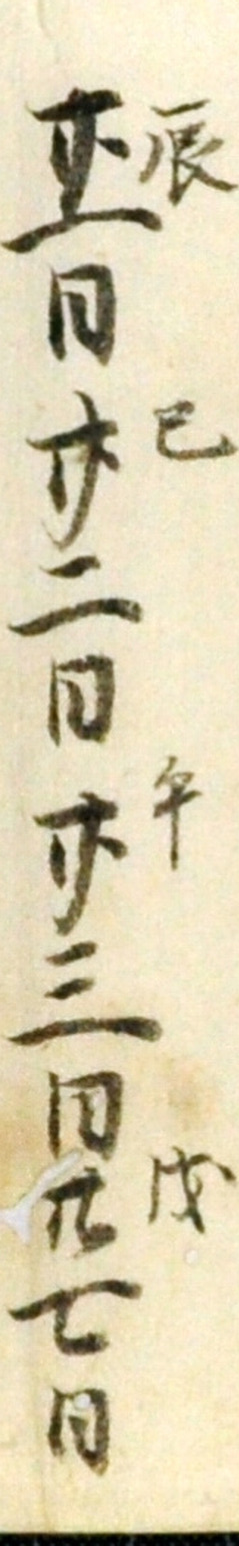廿一日廿二日廿三日廿七日
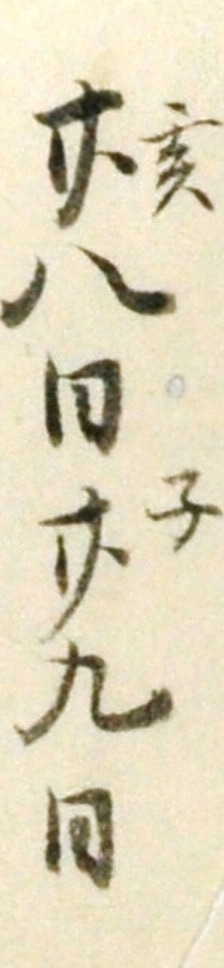廿八日廿九日

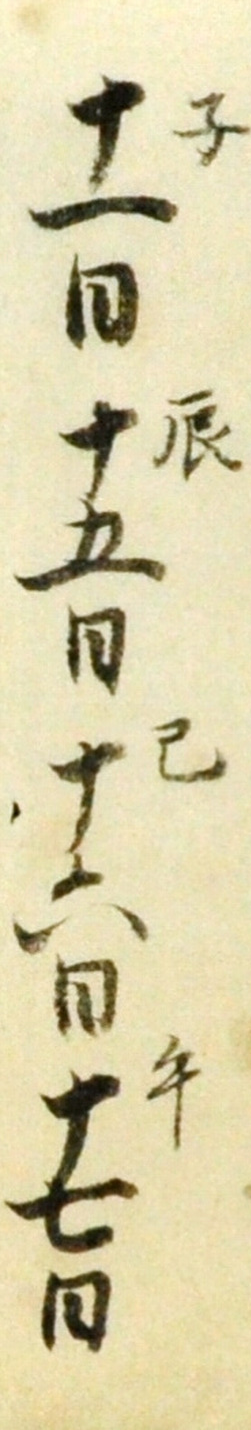十一日十五日十六日十七日
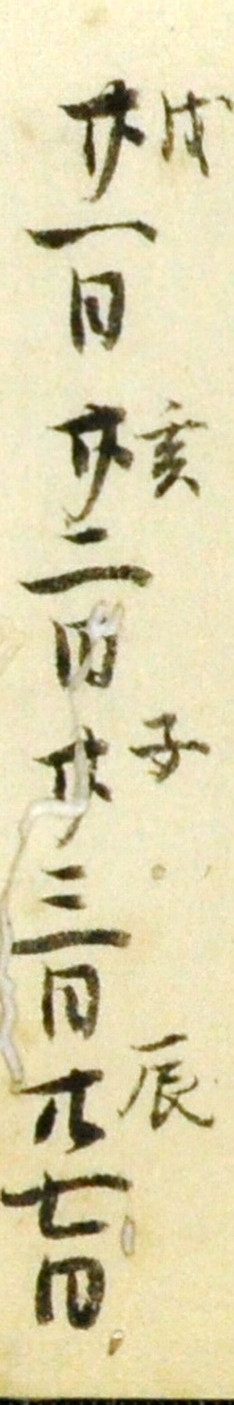廿一日廿二日廿三日廿七日
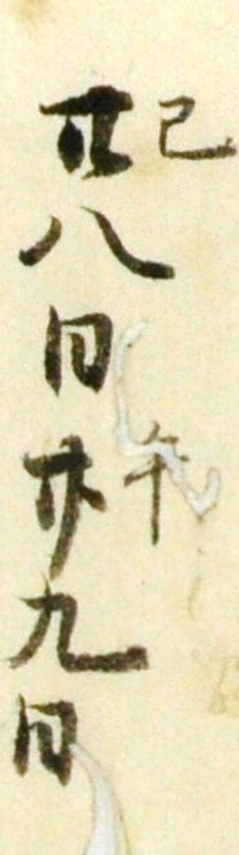廿八日廿九日
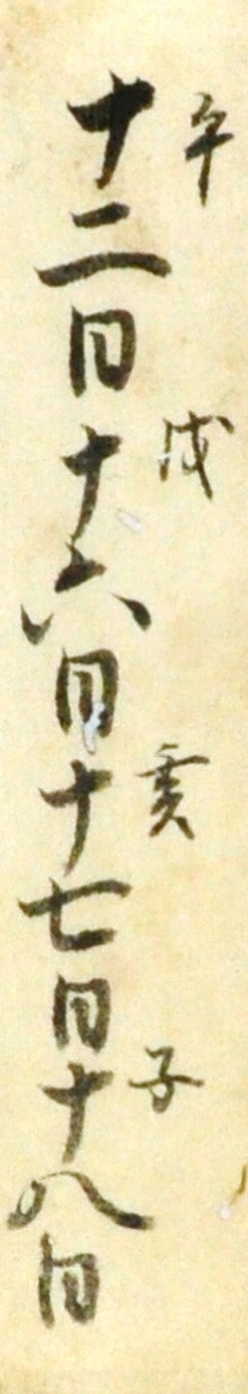十二日十六日十七日十八日
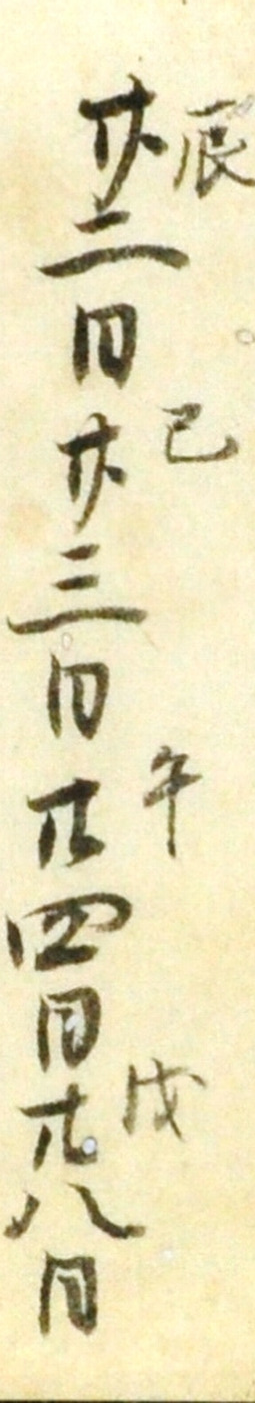廿二日廿三日廿四日廿八日
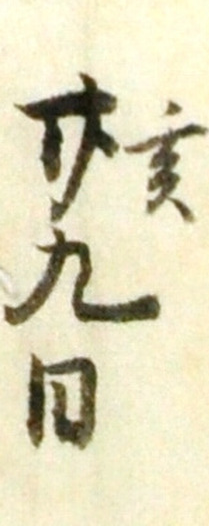廿九日
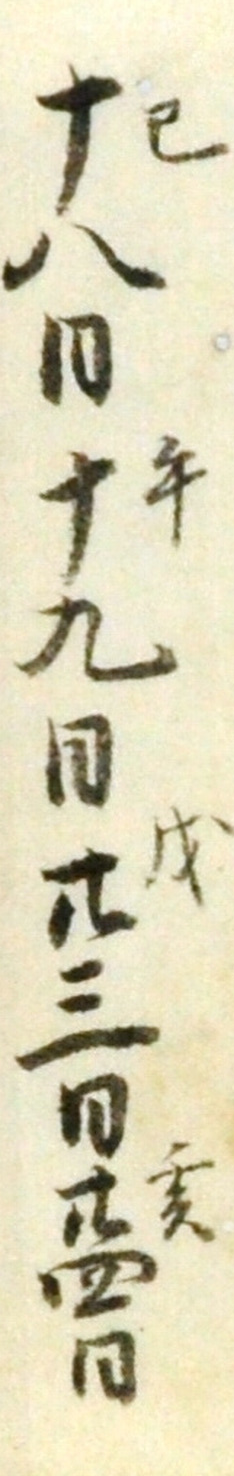十八日十九日廿三日廿四日
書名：元禄三年御徳日書上
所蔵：伊那市立高遠町図書館・合同会社AMANE
